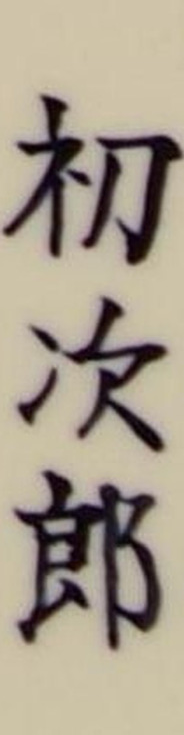初次郎
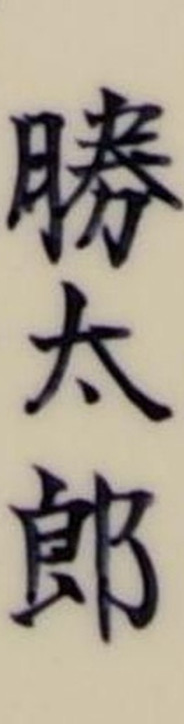勝太郎
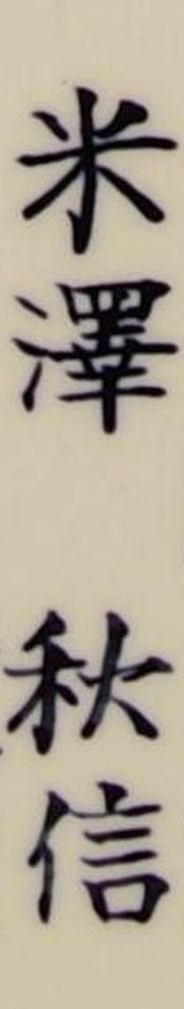米澤秋信
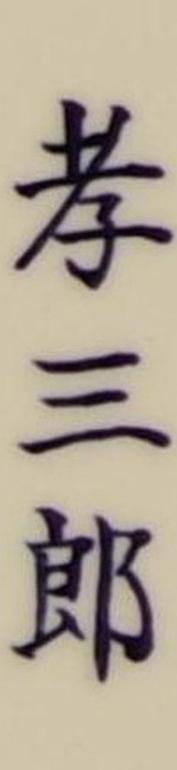孝三郎
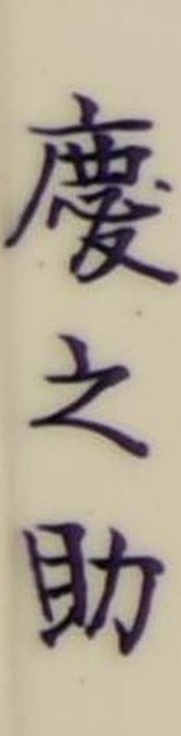慶之助

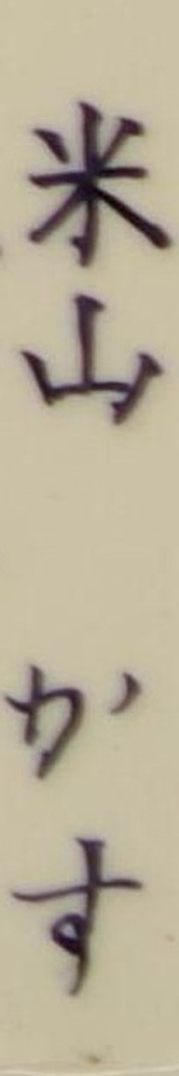米山かす
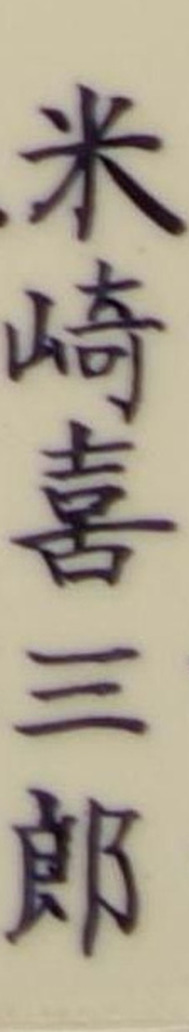米崎喜三郎
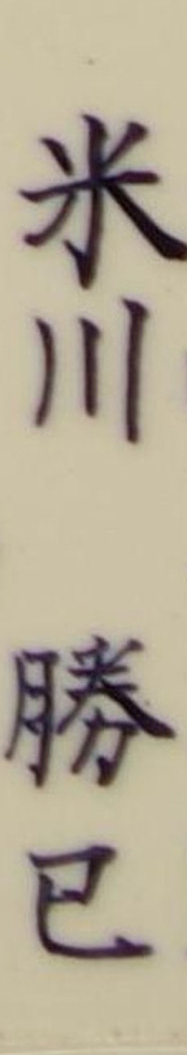米川勝巳
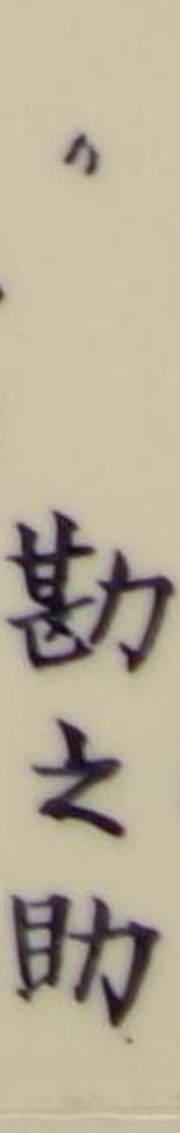勘之助
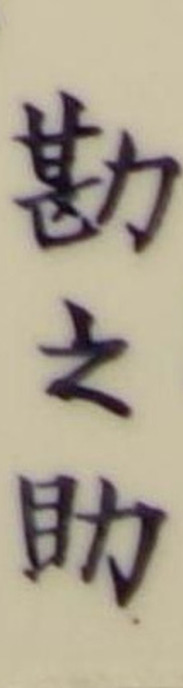勘之助
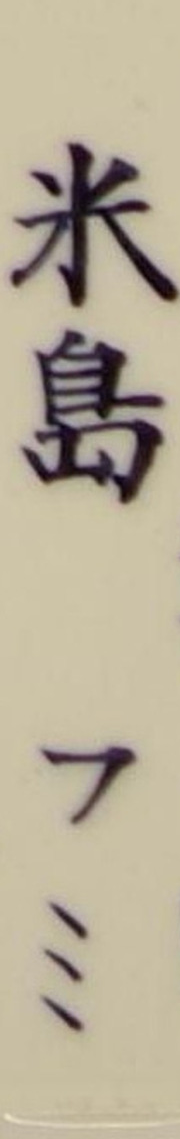米島フミ
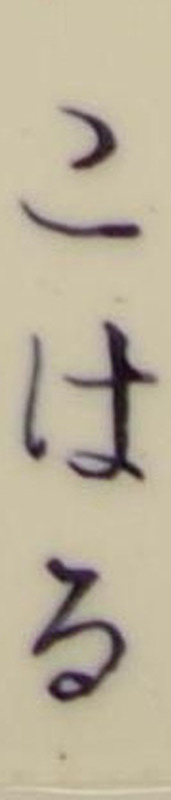こはる
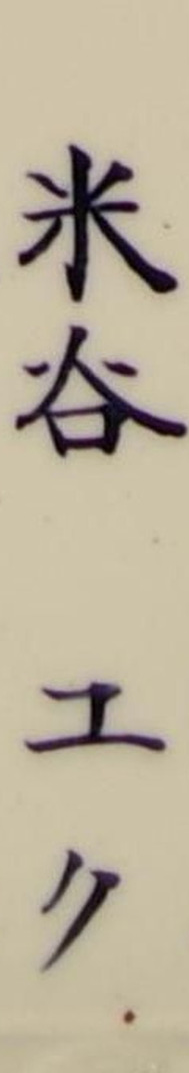米谷ユク
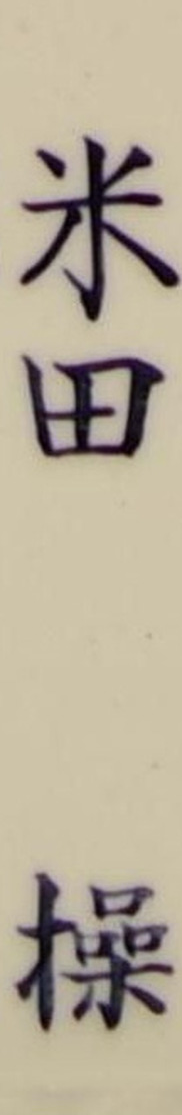米田操
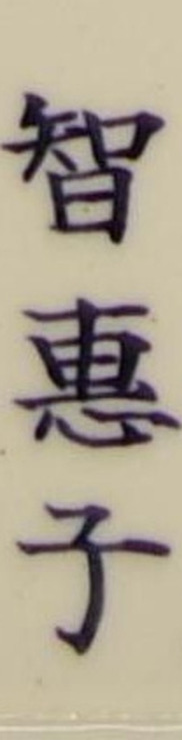智恵子
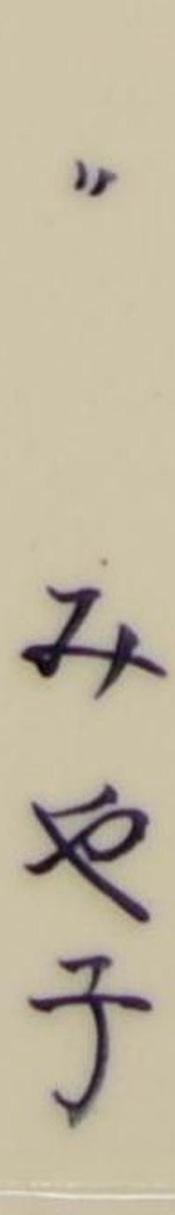みや子
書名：E~L
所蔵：高野山金剛峯寺
